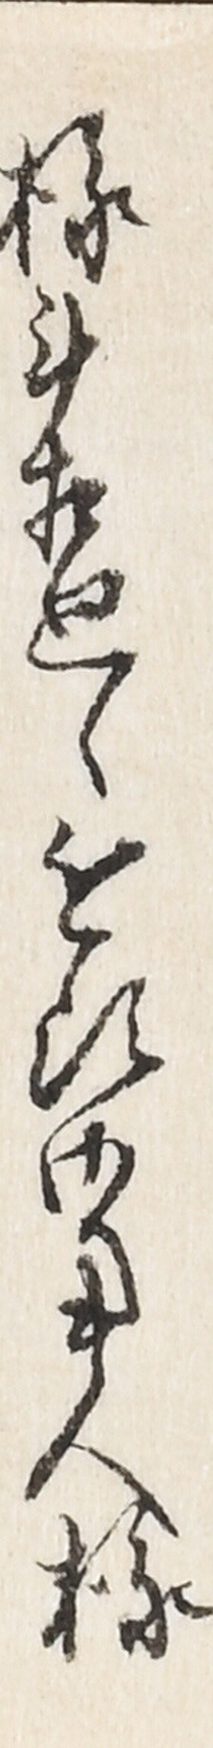様斗相廻候近頭御用人様
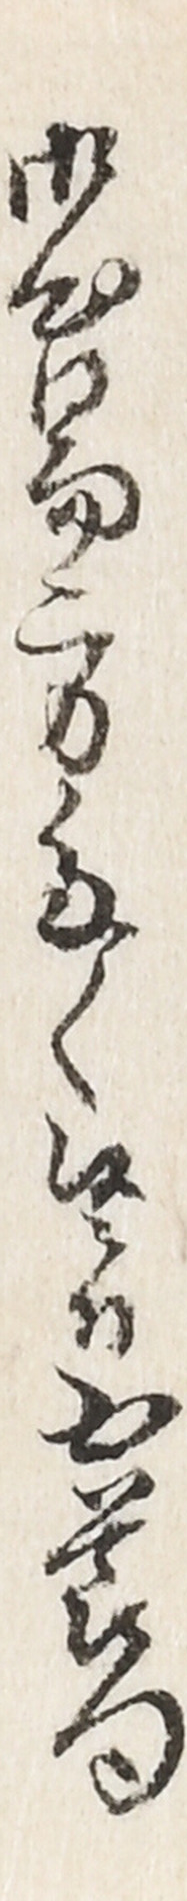御心同易方多く候ニ付五節句
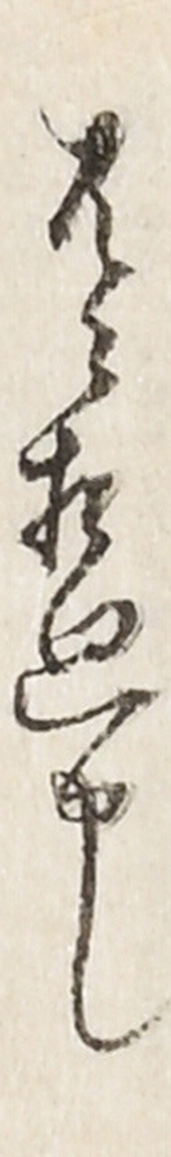共ニ相廻申候
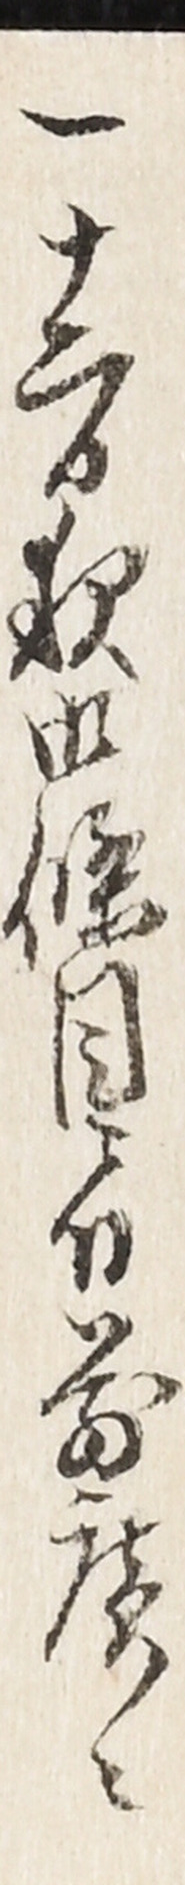一十二日夜御條目ニ付前広ニ
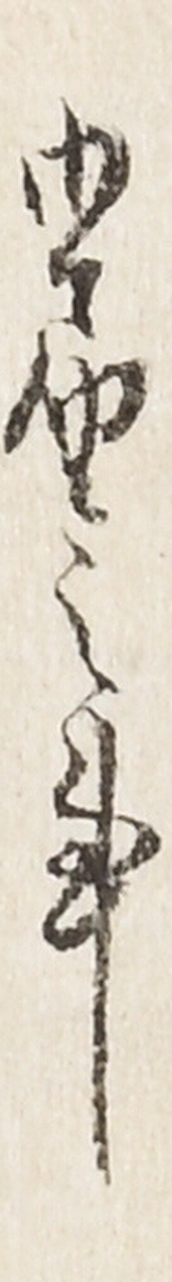御届之事
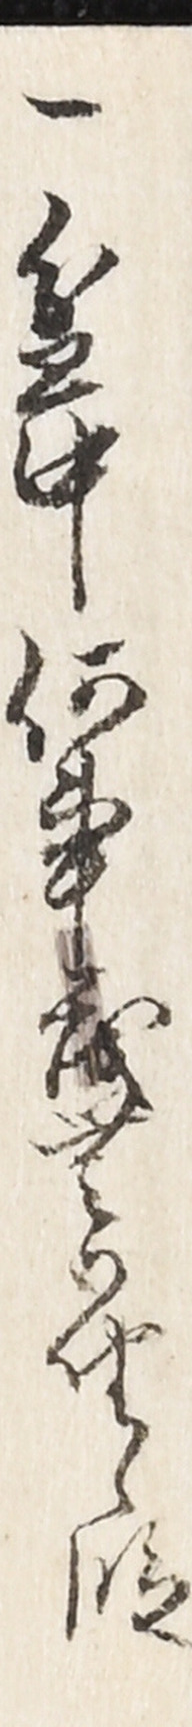一盆中何事も無御座候段
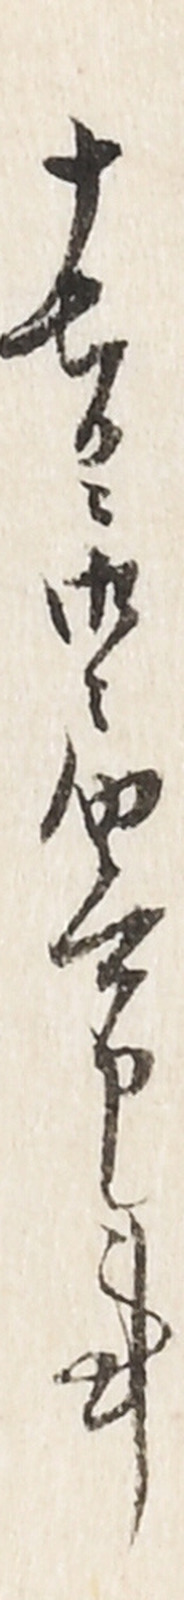十七日ニ御届可申事
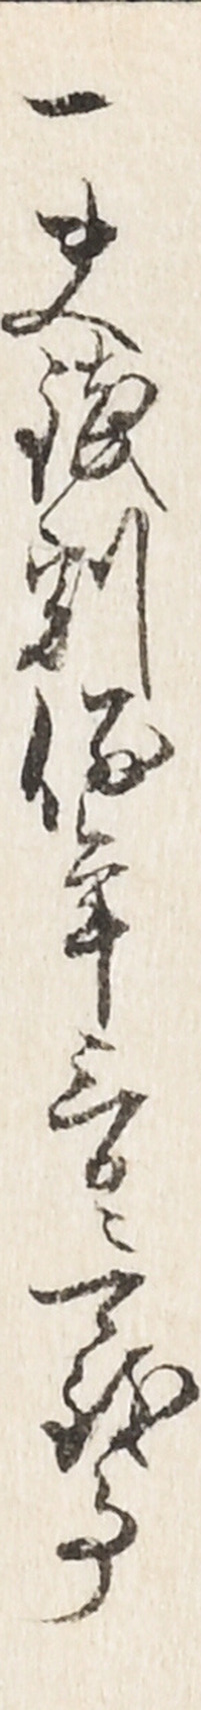一夫錢割例年三日ニ可致事
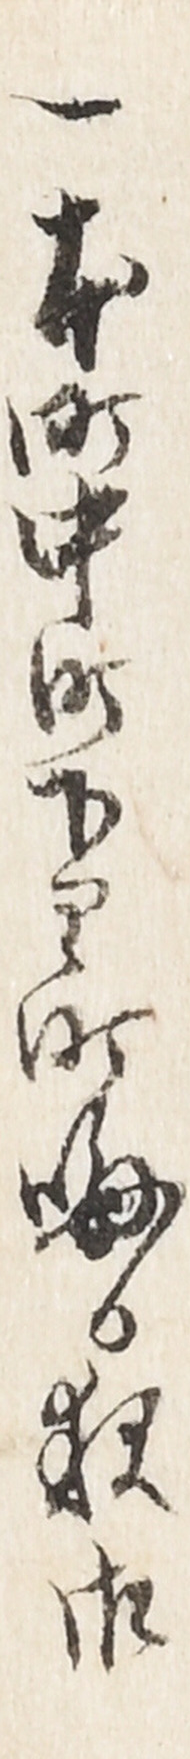一本町中町下里町晦日夜御
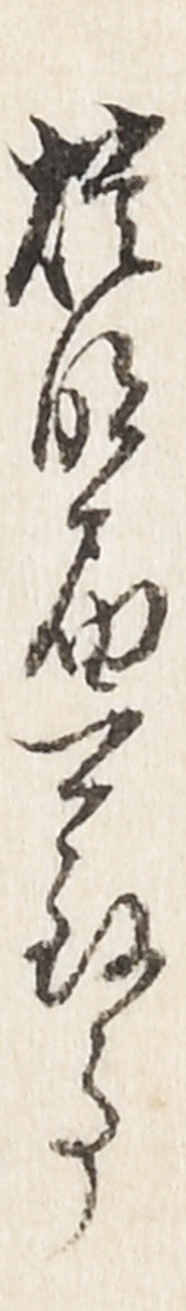燈明届可致事

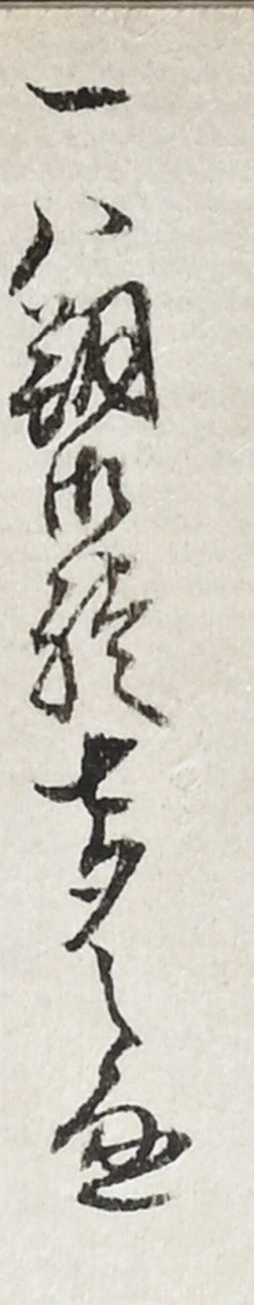一八朔御礼多之通
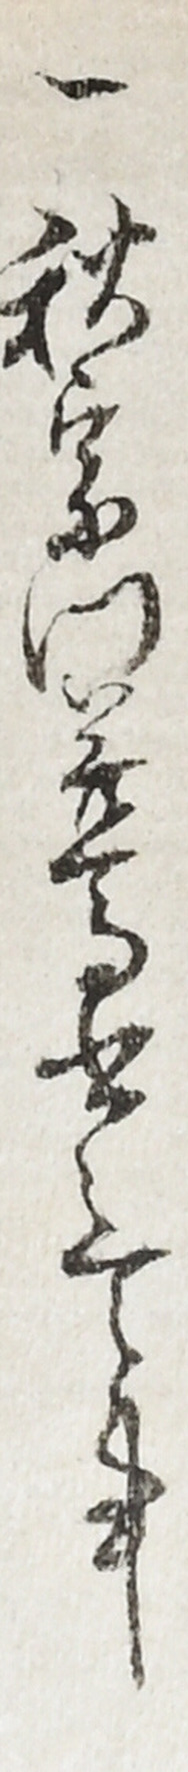一秋宗門并馬書之事
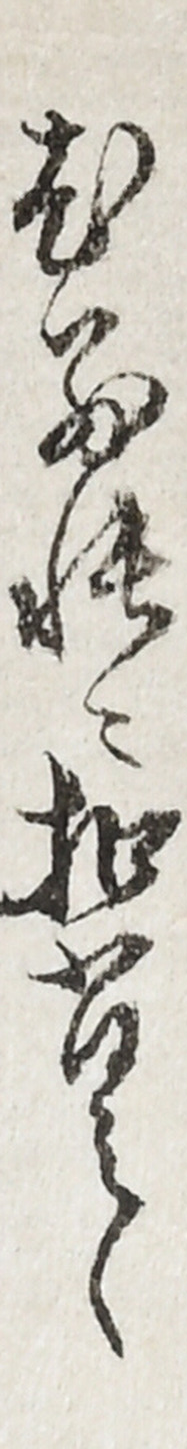尤別帳ニ扣有之候
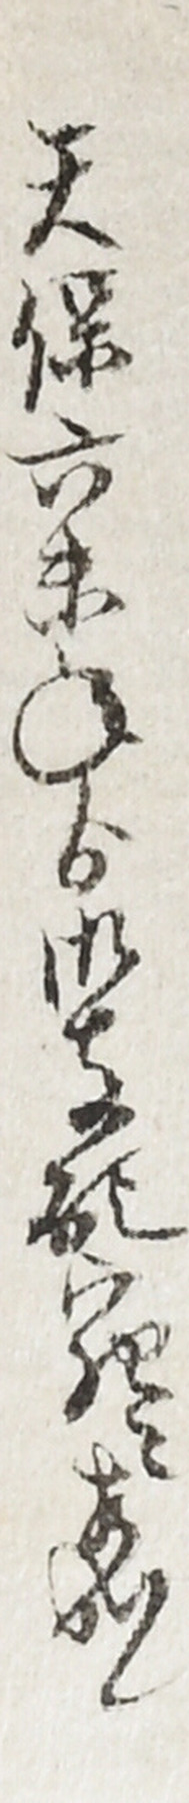天保六未年より御支配迄ニ相成候
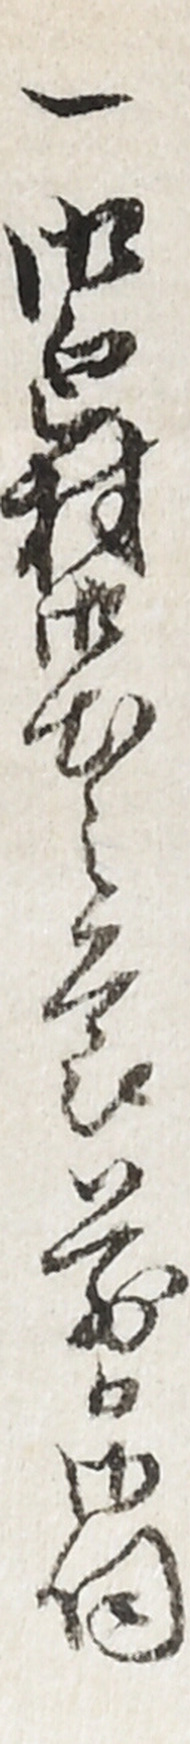一御廻村御出之節前日御伺
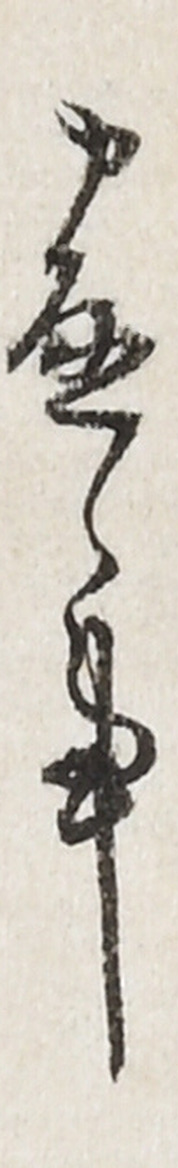申通候事
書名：年内行事懐中録
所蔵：伊那市立高遠町図書館・合同会社AMANE
